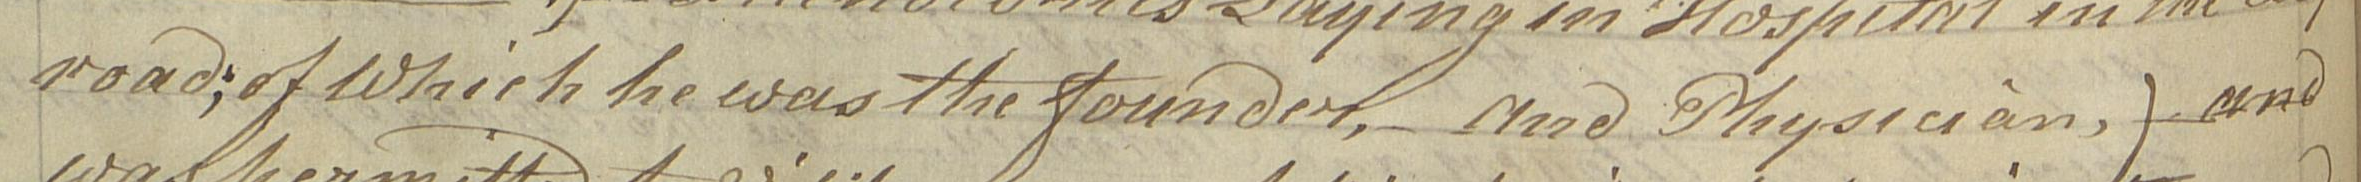road; of Which he was the founder, and Physician,) and
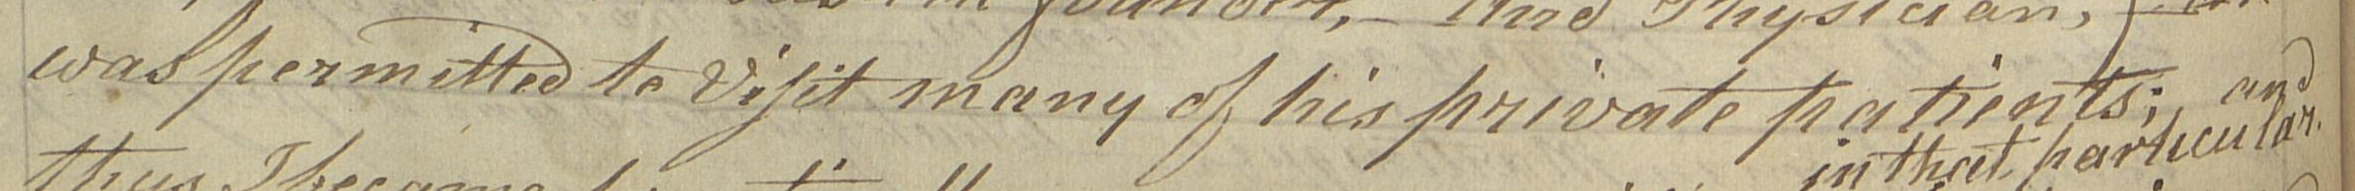was permitted to Visit many of his private patients; and
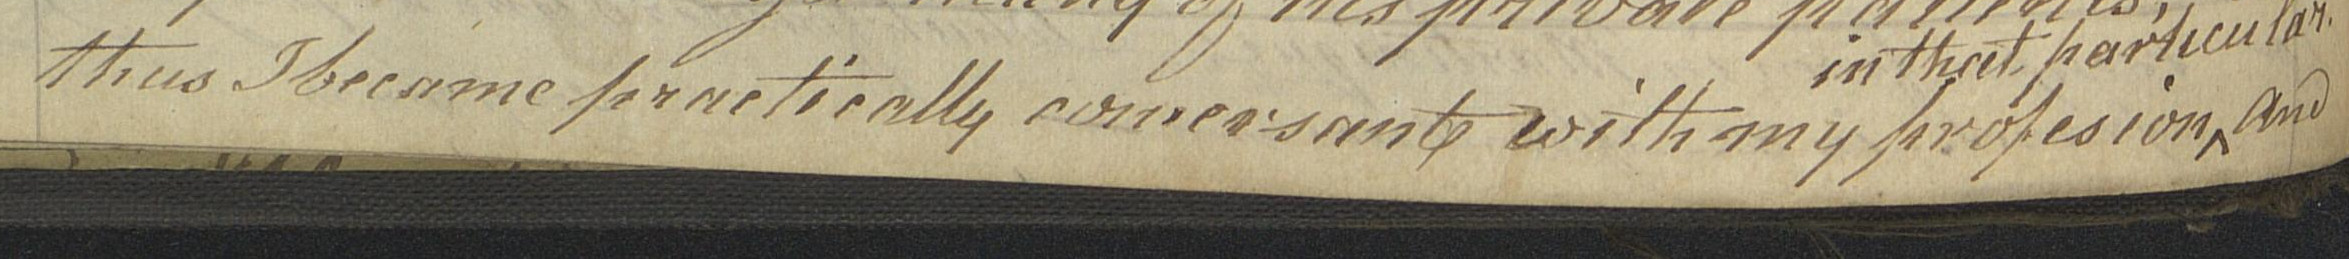thus I became practically conversant with my profesion ^ And
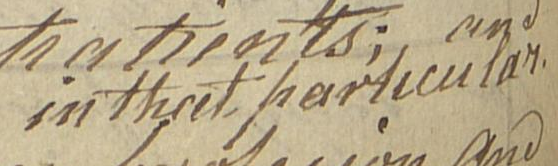in that particular
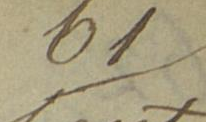61
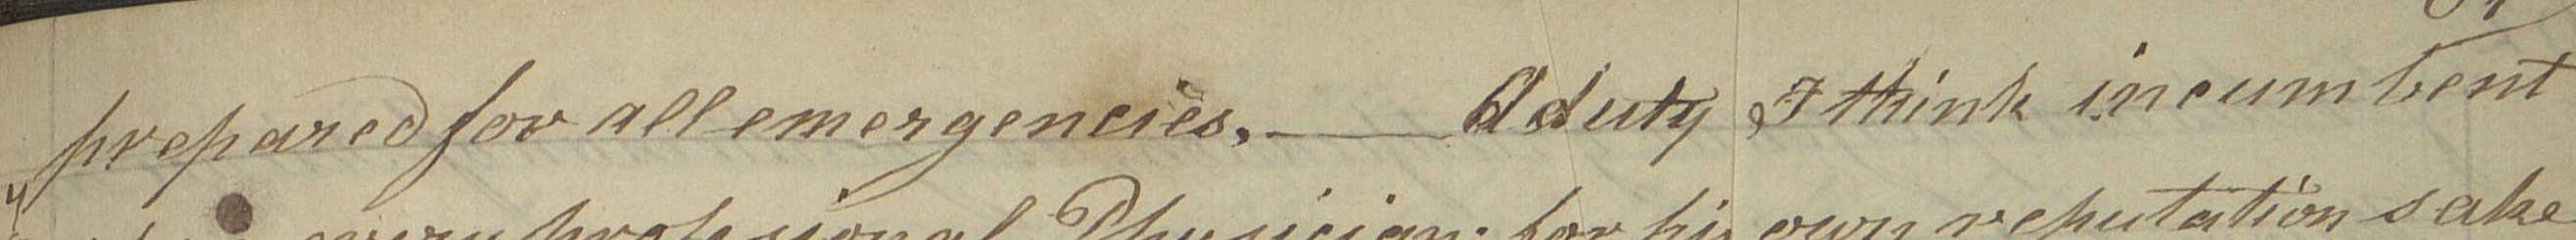prepared for all emergencies. A duty I think incumbent
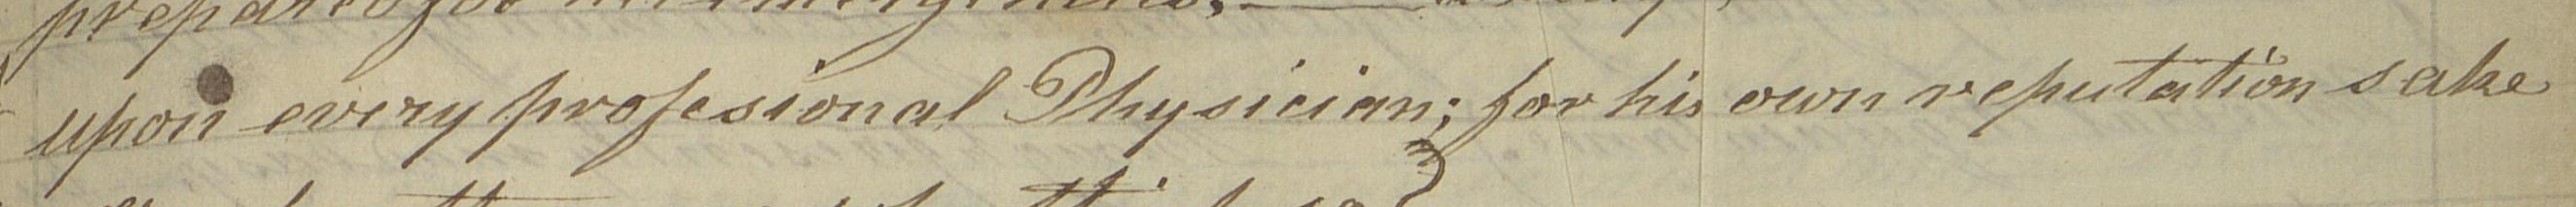upond every profesional Physician; for his own reputation sake
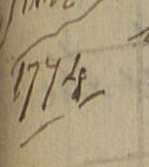1774
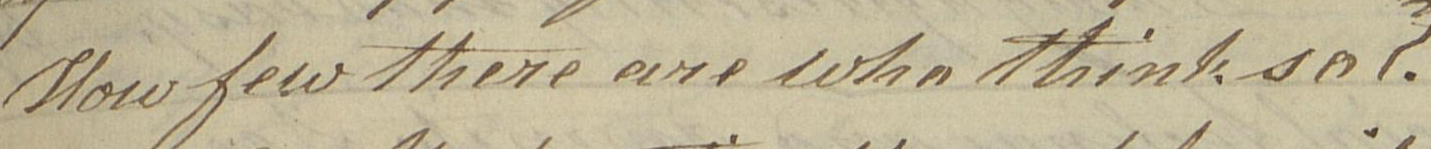How few there are who think so?
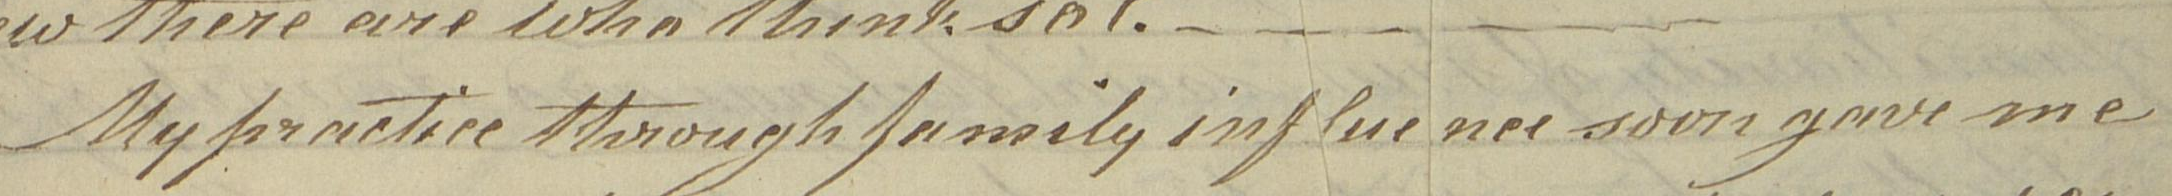My practice through family influence soon gave me
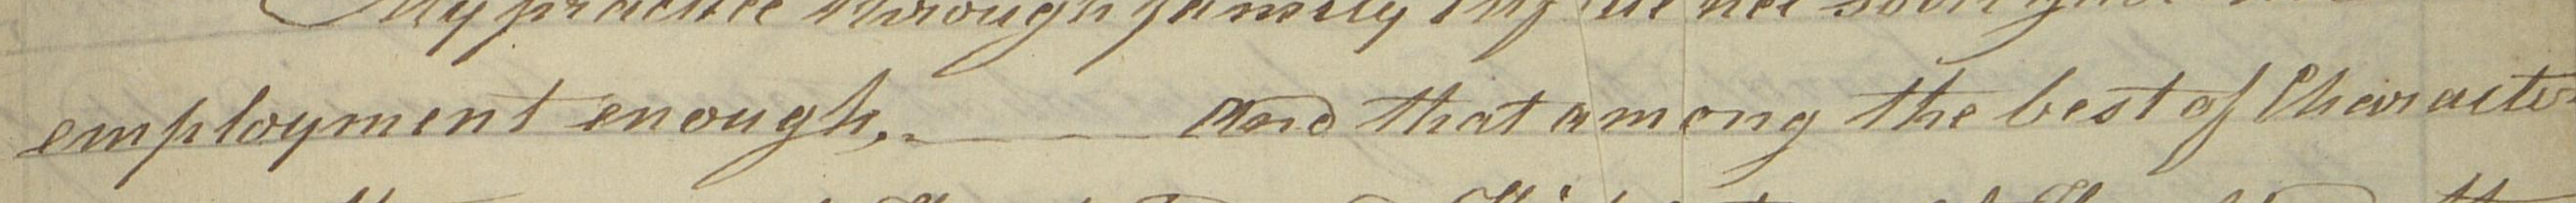employment enough. And that among the best of Character
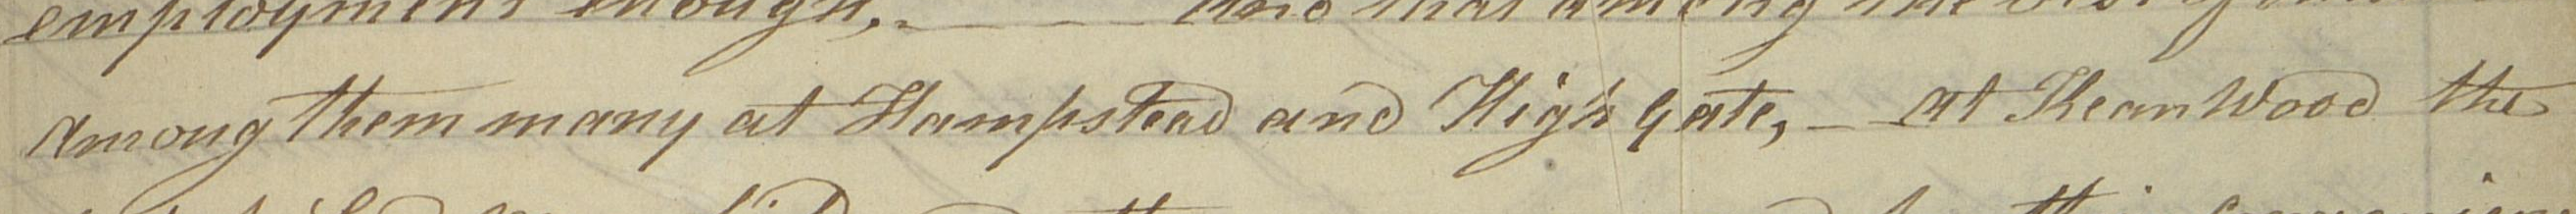among them many at Hampstead and High Gate, At Kean Wood the
